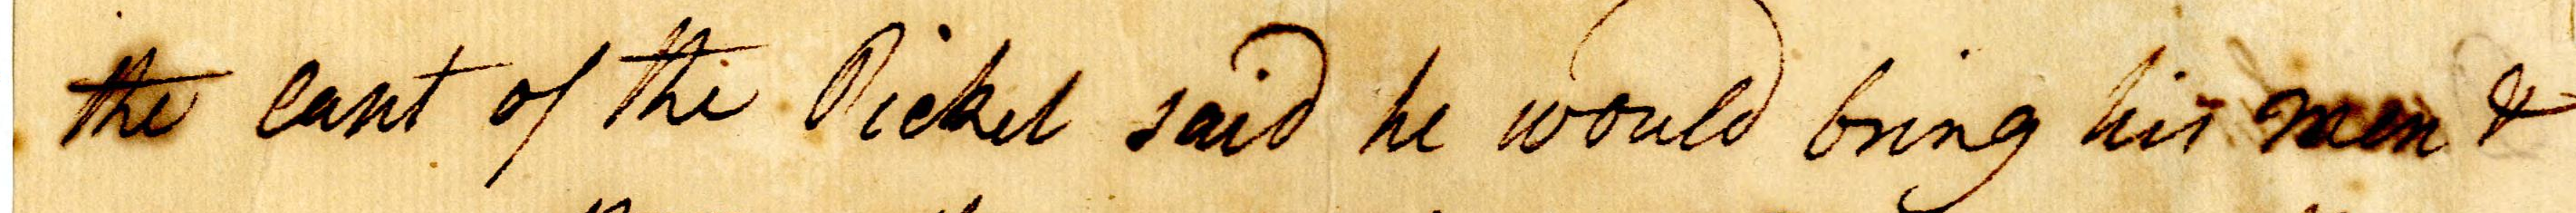the Cant of the Picket said he would bring his men &
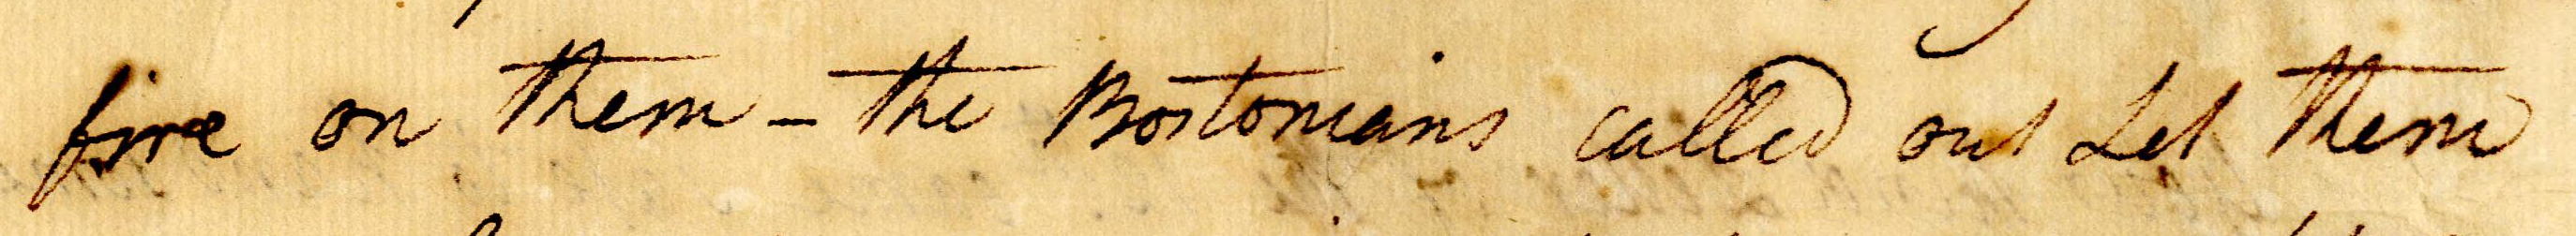fire on them- the Bostonians called out Let them
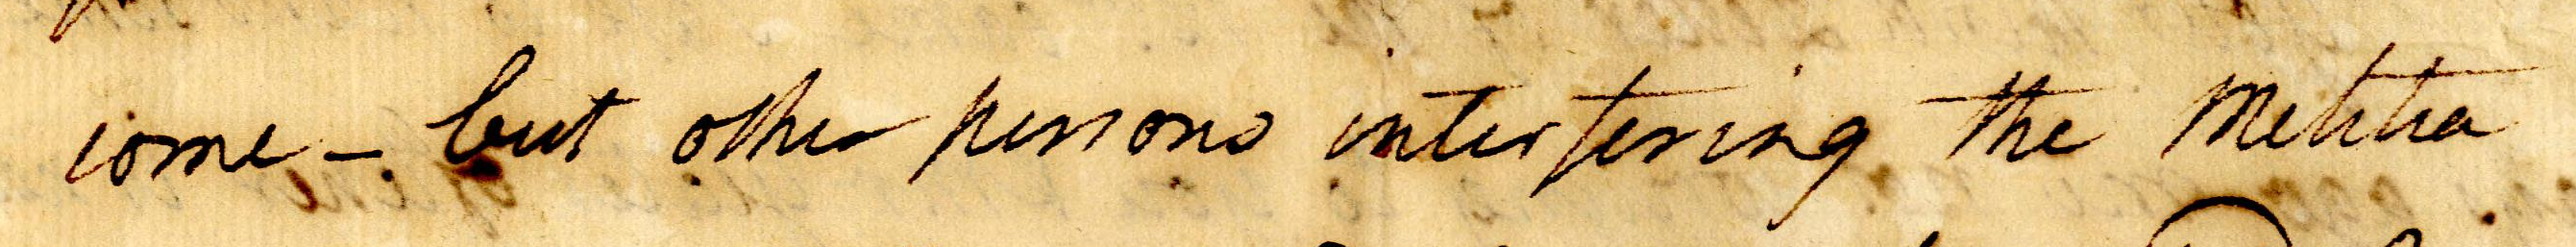come-. but other persons interfering the Militia
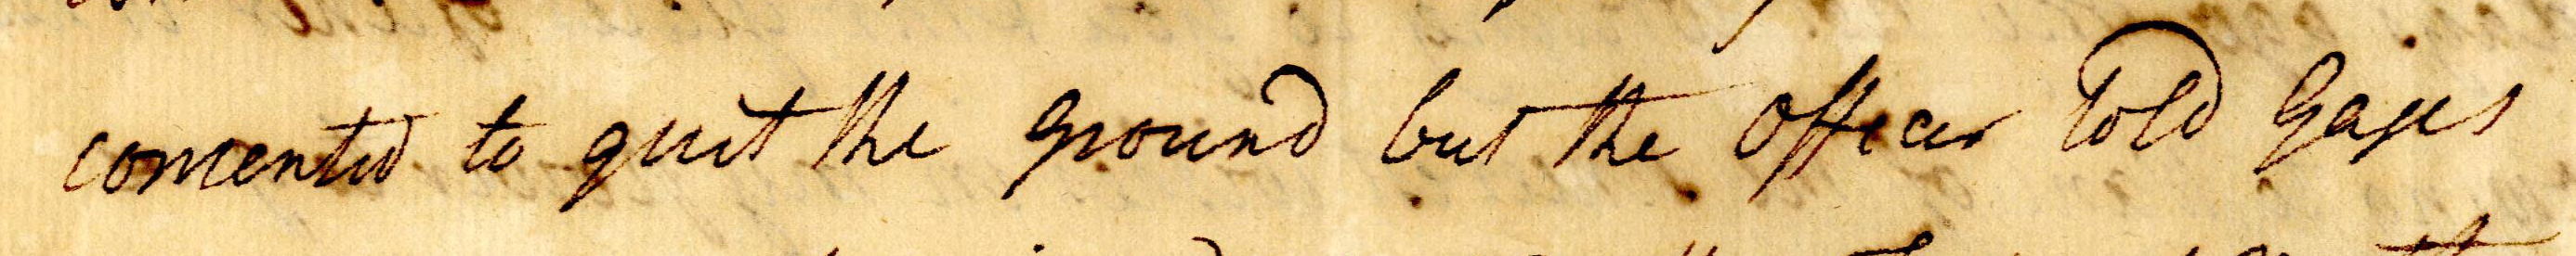comented to quit the ground but the Officer told Gages
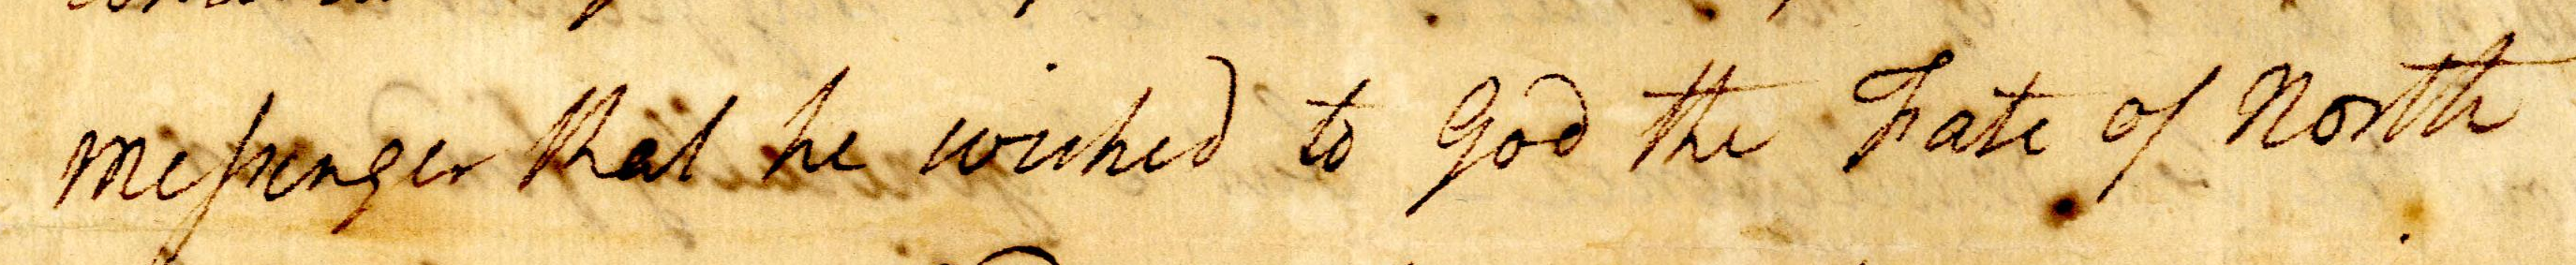messenger that he wished to God the Fate of North
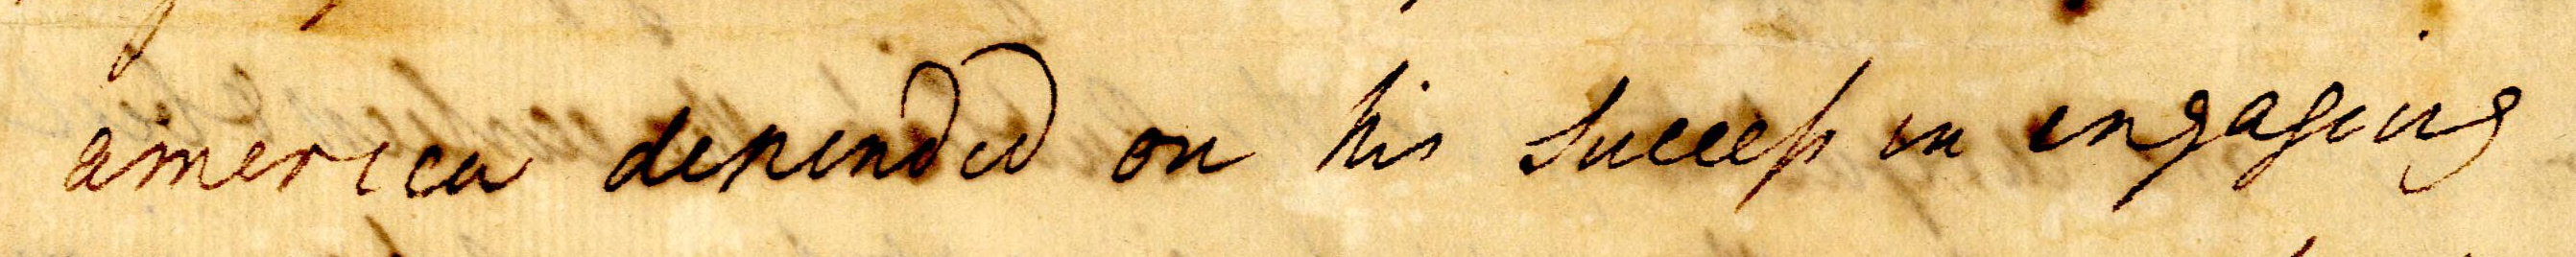America depended on his success in engaging
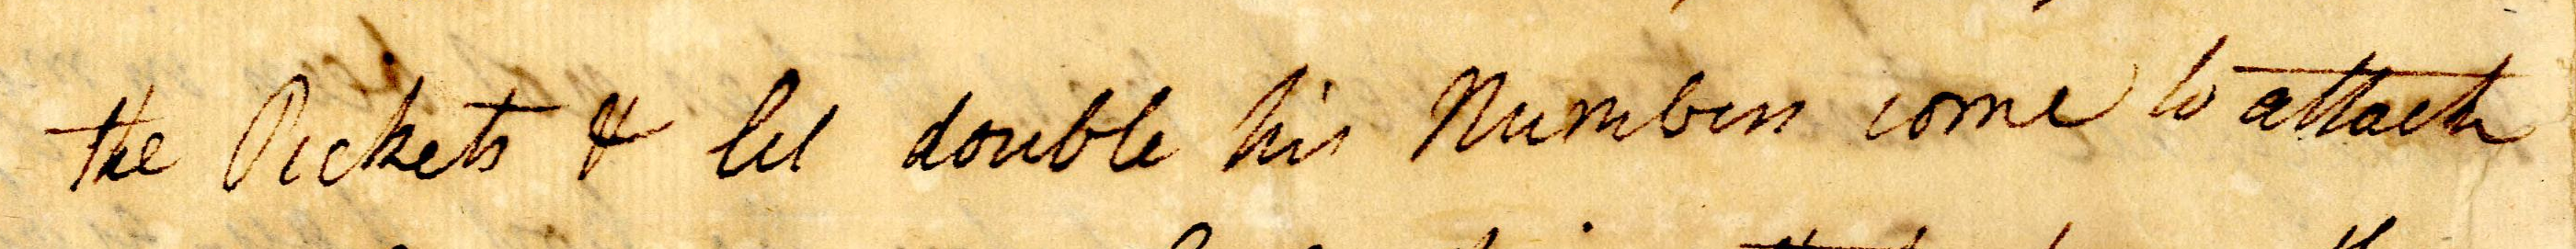the Pickets & let double his Number come to attack
